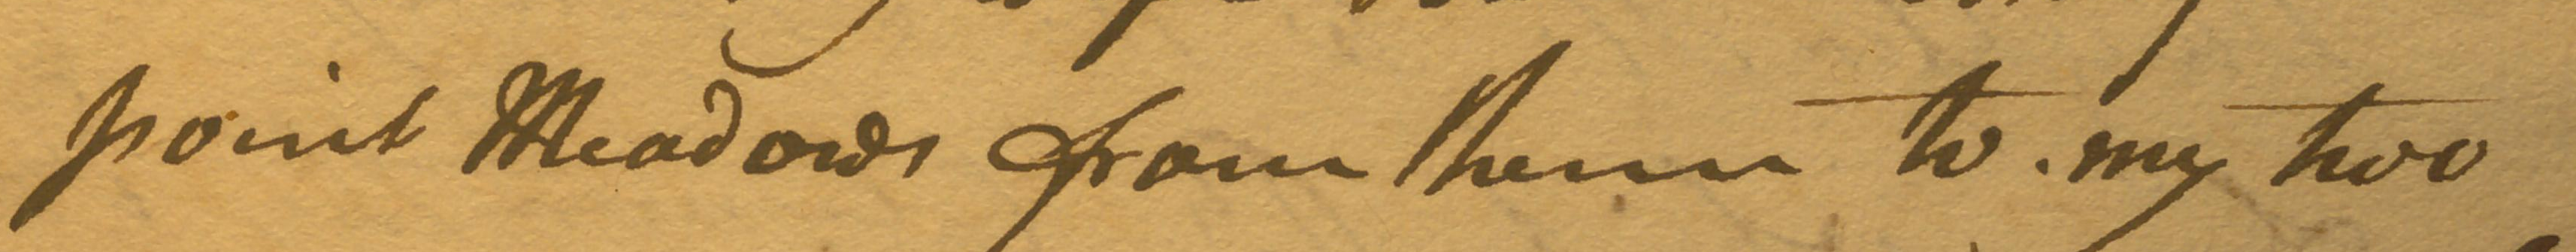point Meadows from thence to my two
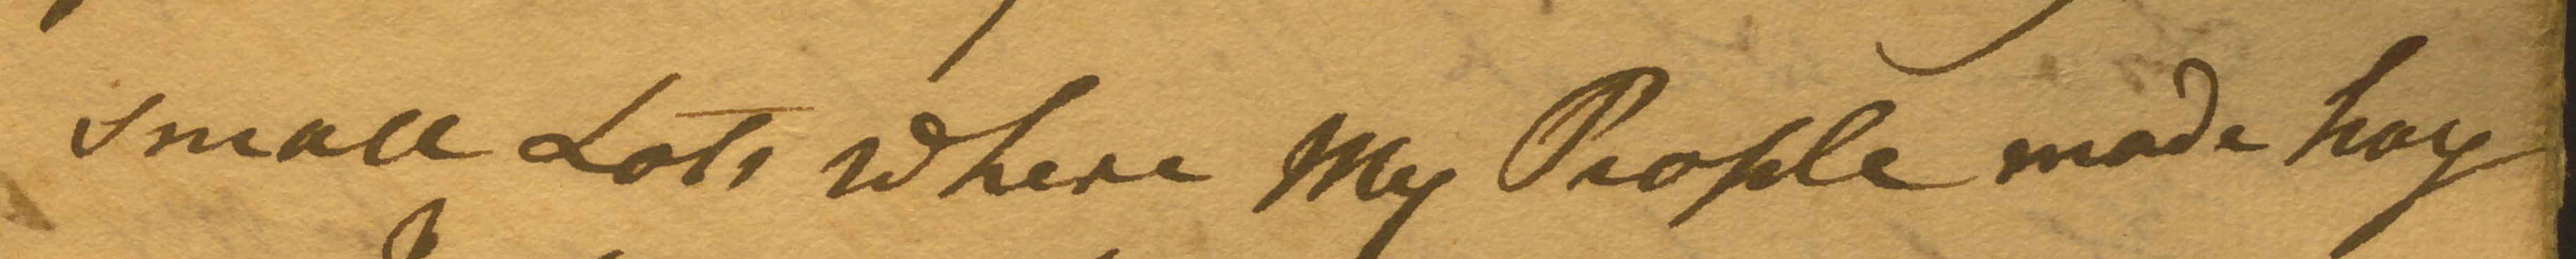small Lots where My People made hay
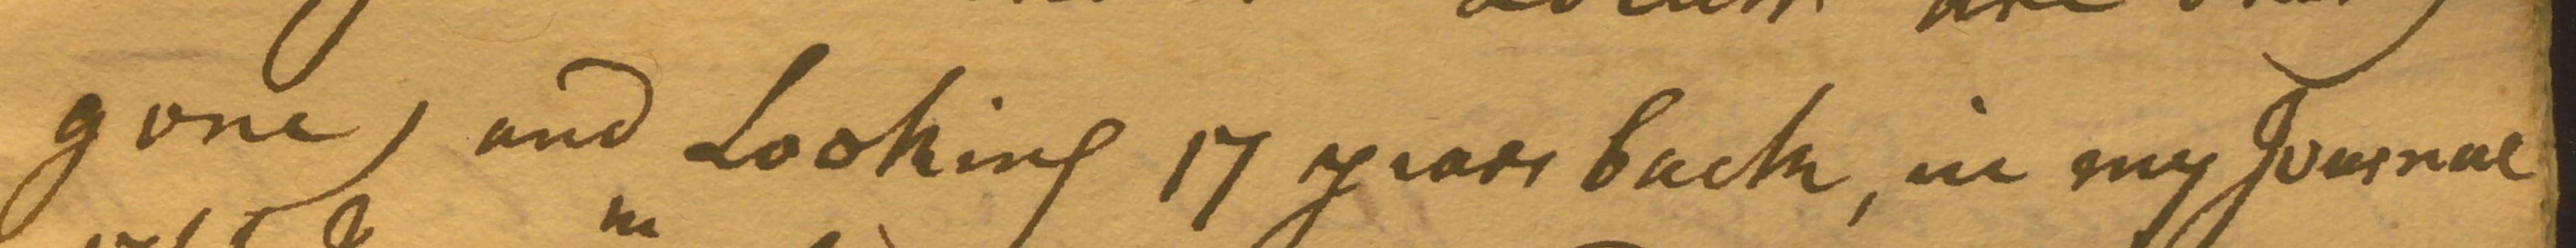gone) and Looking 17 years back in my Journal
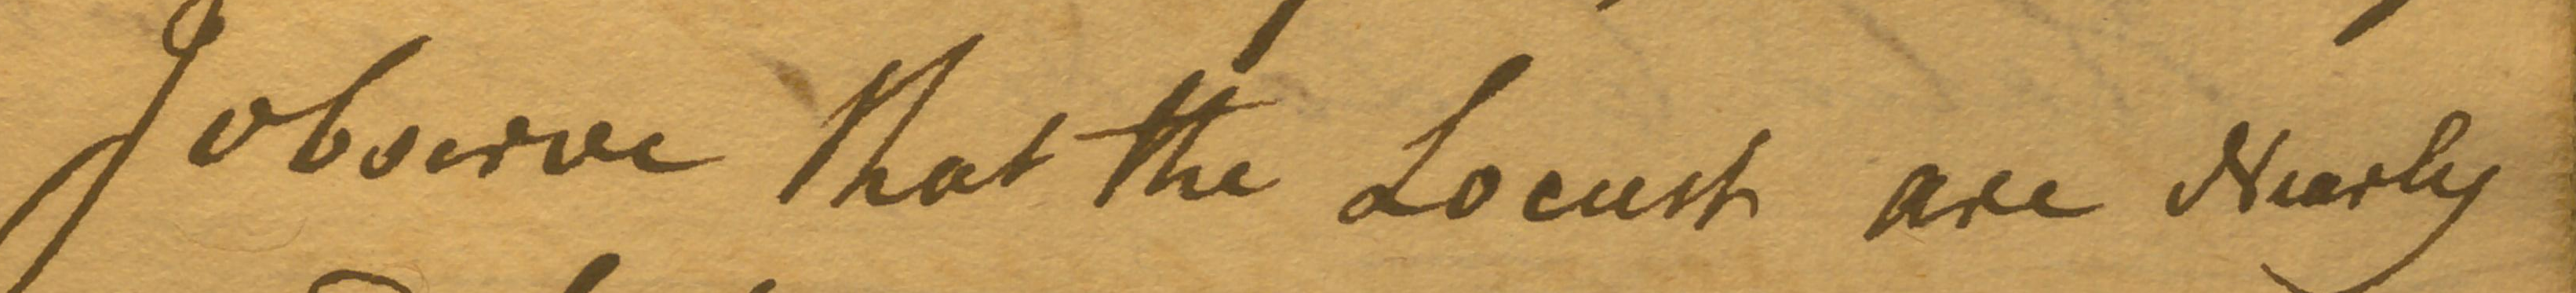I observe that the Locust are Nearly
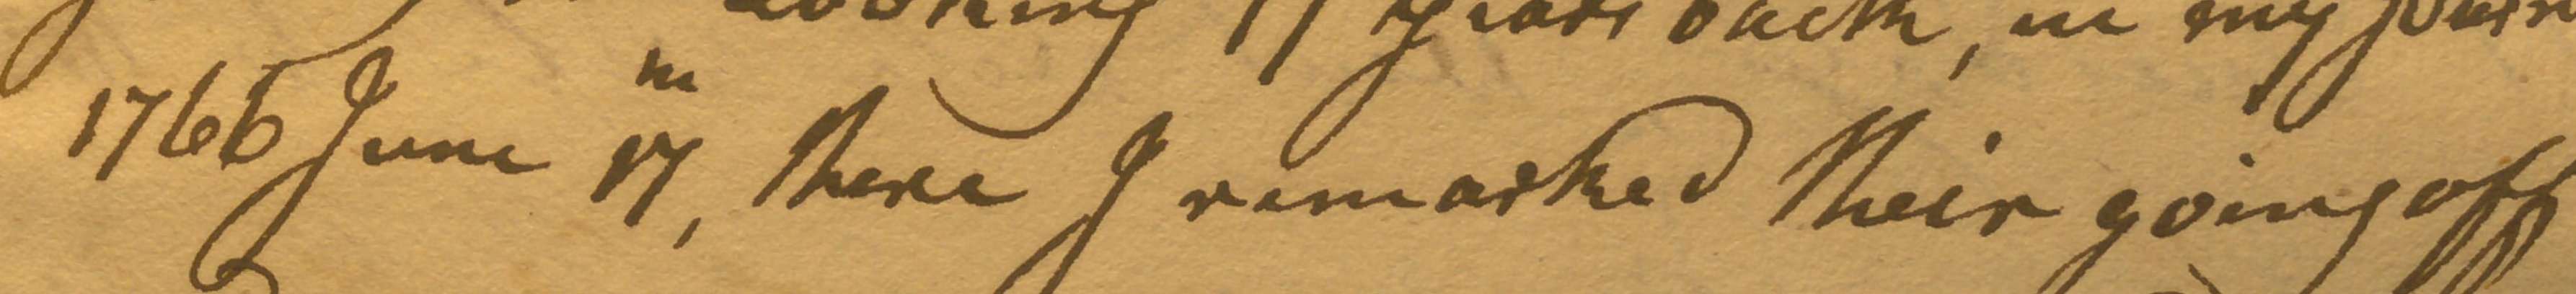1766 June 17^th there I remarked their going off
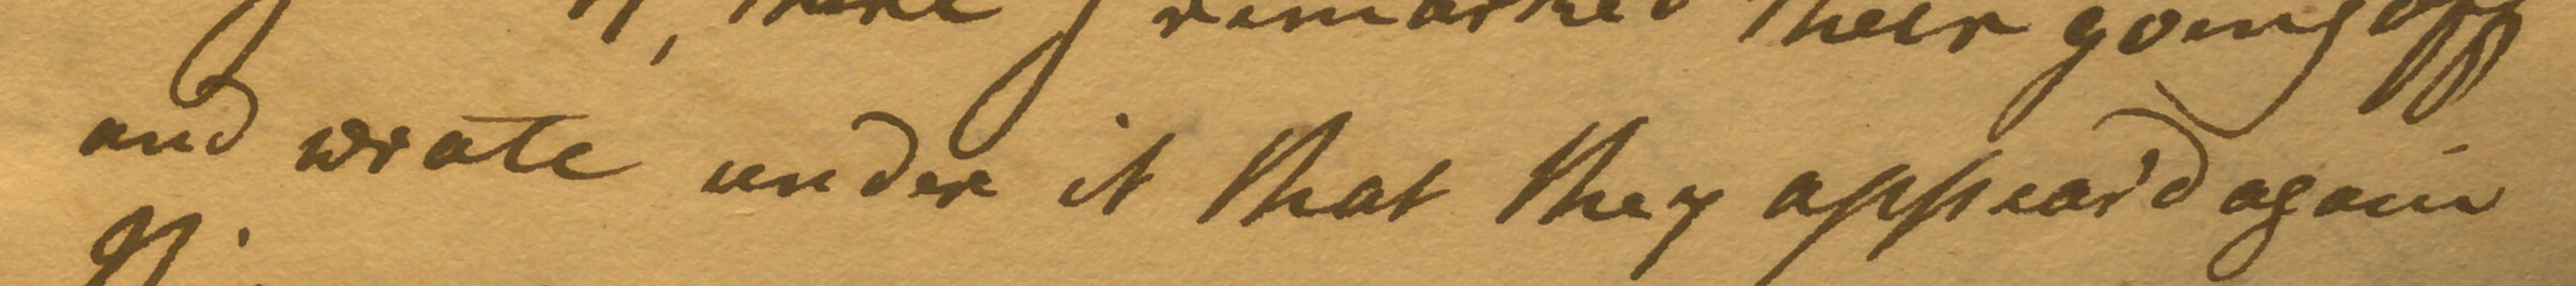and wrote under it that they appear'd again
